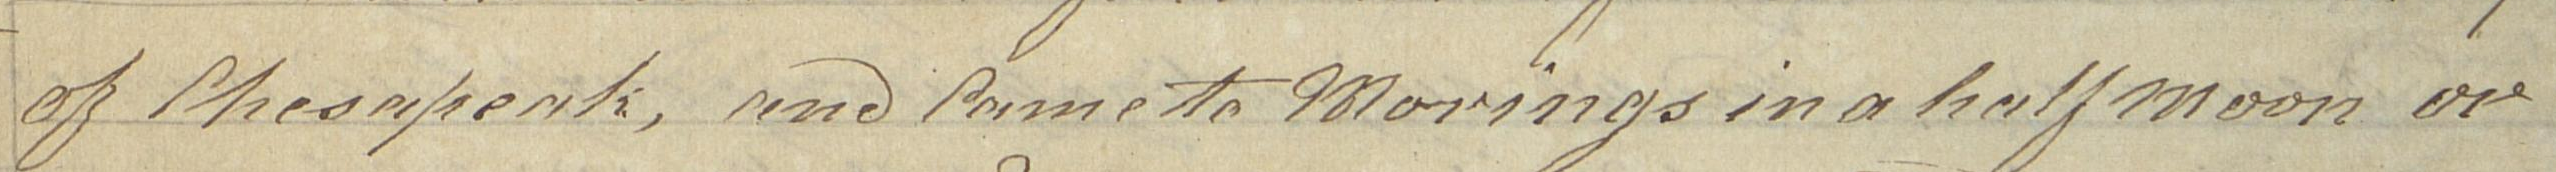of Chesapeak, and came to Morings in a half Moon or
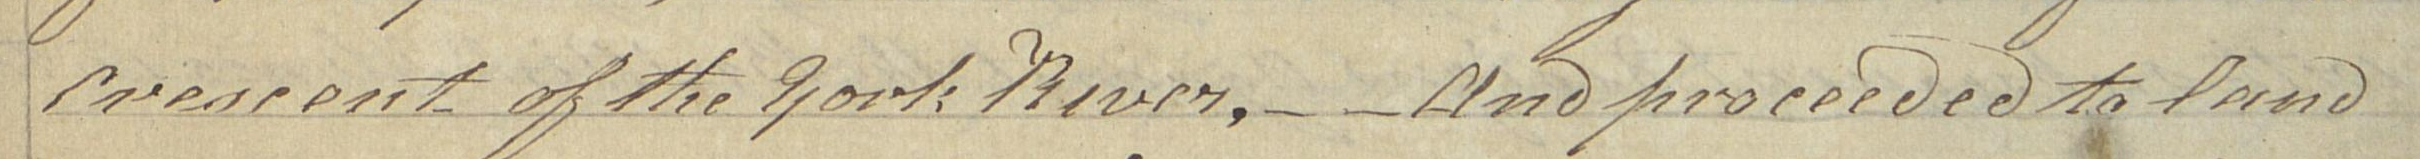crescent of the York River, And proceeded to land
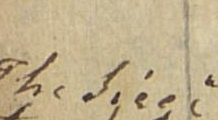The Siege
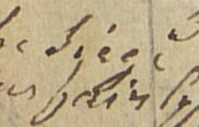thus fairly
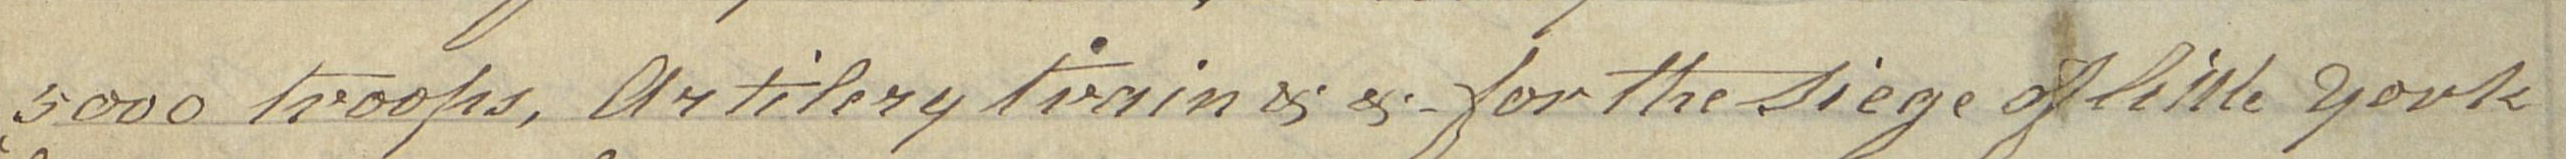5000 troops, Artilery train & & for the Siege of little York
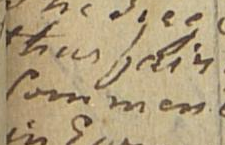Commentd
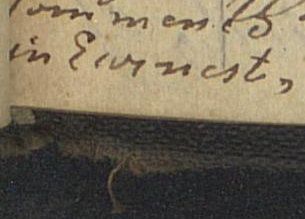inEarnest,
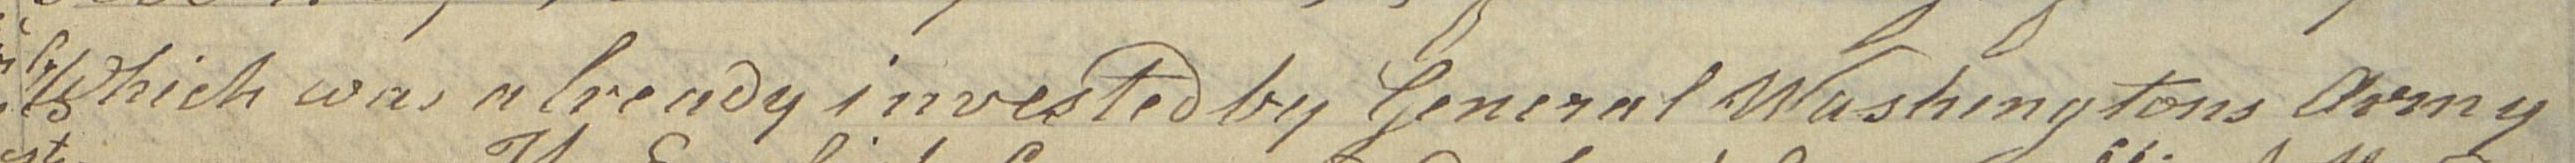Which was already invested by General Washingtons Army
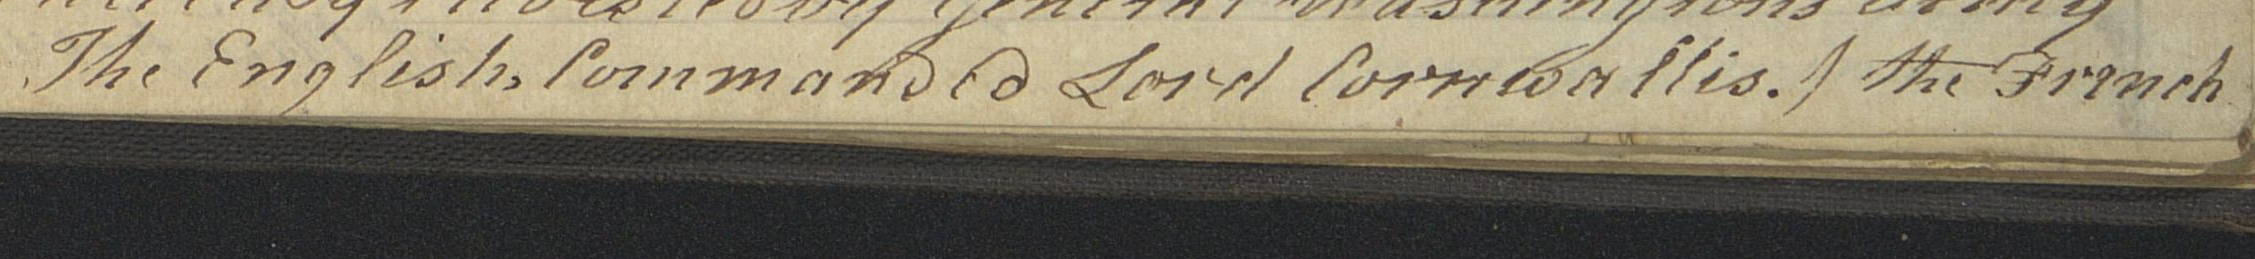The English, Commanded Lord Cornwallis.) the French
